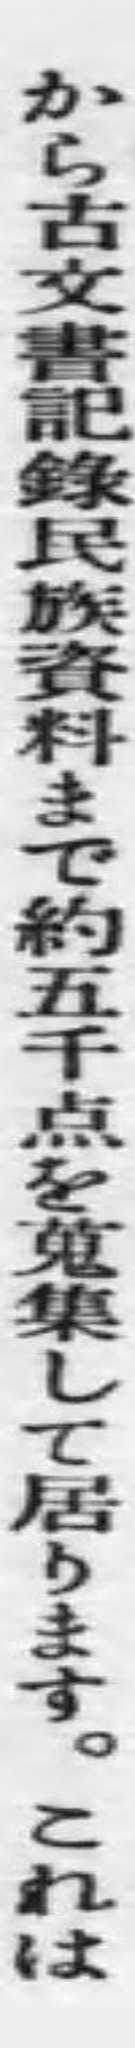から古文書記錄民族資料まで約五千点を蒐集して居ります。これは
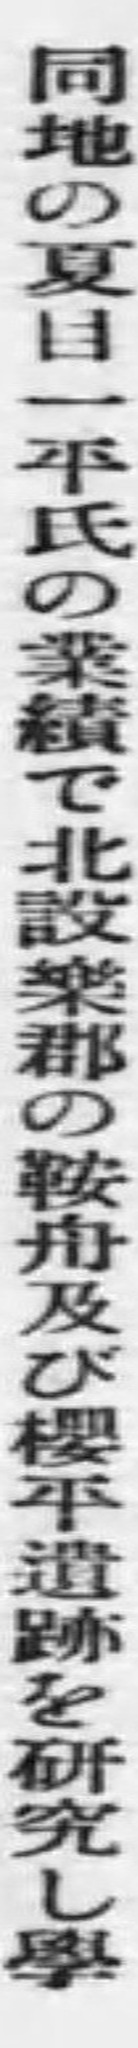同地の夏目一平氏の業績で北設樂郡の鞍舟及び櫻平遺跡を研究し學
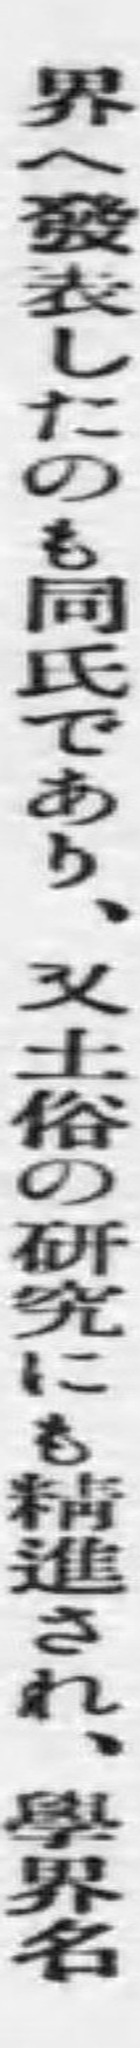界へ發表したのも同氏であり、又土俗の研究にも精進され、學界名
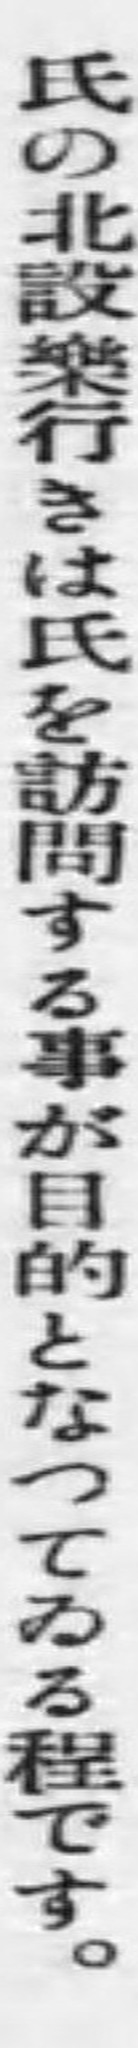氏の北設樂行きは氏を訪問する事が目的となつてゐる程です。
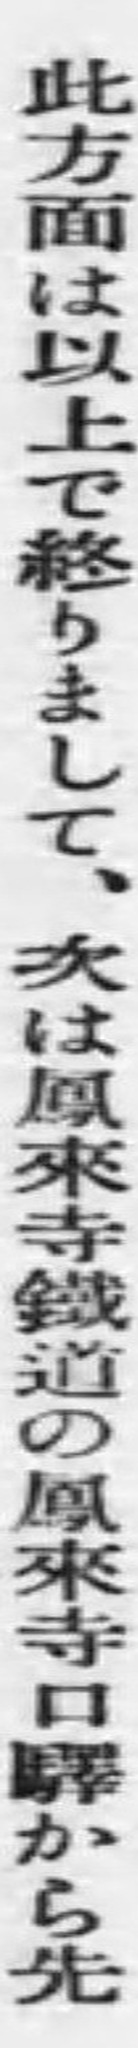此方面は以上で終りまして、次は鳳來寺鐵道の鳳來寺口驛から先
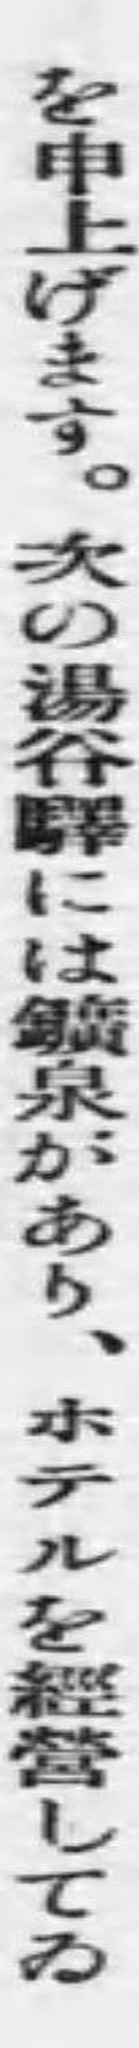を申上げます。次の湯谷驛には鑛泉があり、ホテルを經營してゐ
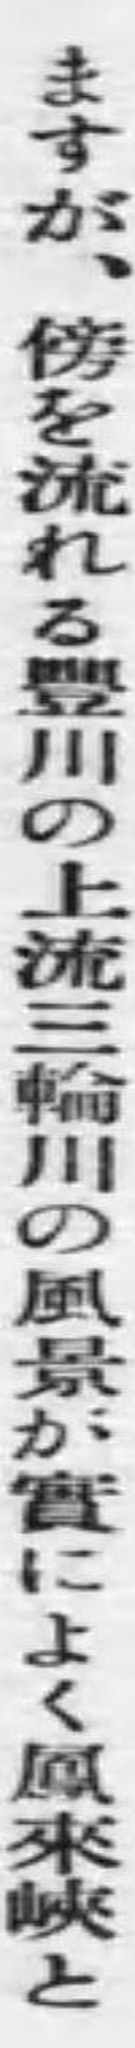ますが、傍を流れる豊川の上流三輪川の風景が實によく鳳來峽と
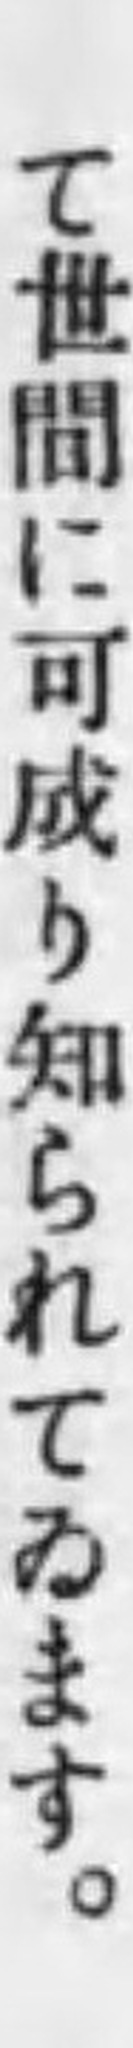て世間に可成り知られてゐます。
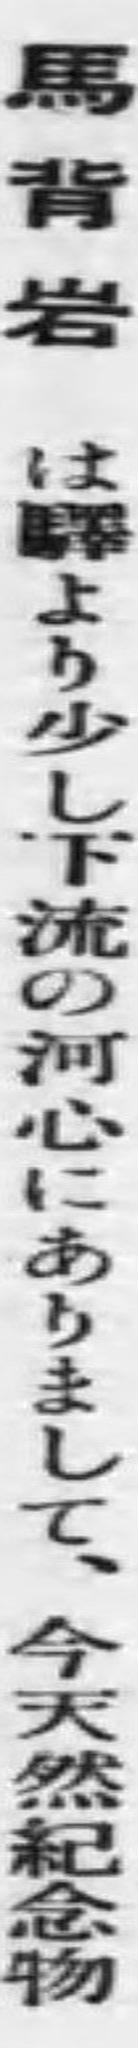馬背岩は驛より少し下流の河心にありまして、今天然紀念物
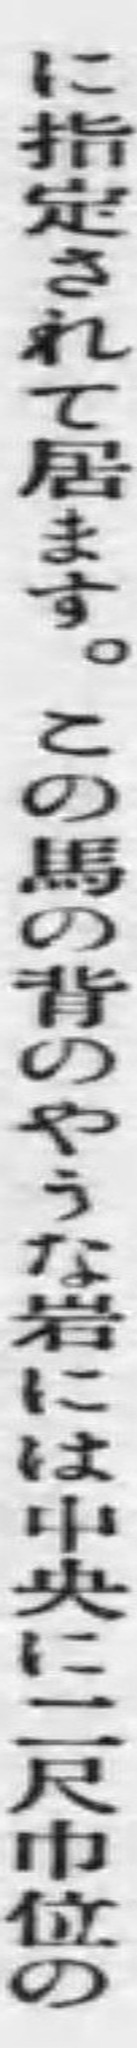に指定されて居ます。この馬の背のやうな岩には中央に二尺巾位の
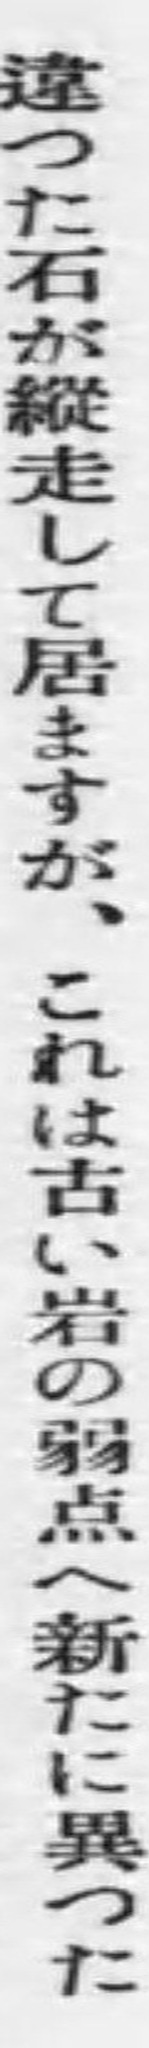違つた石が縱走して居ますが、これは古い岩の弱点へ新たに異つた
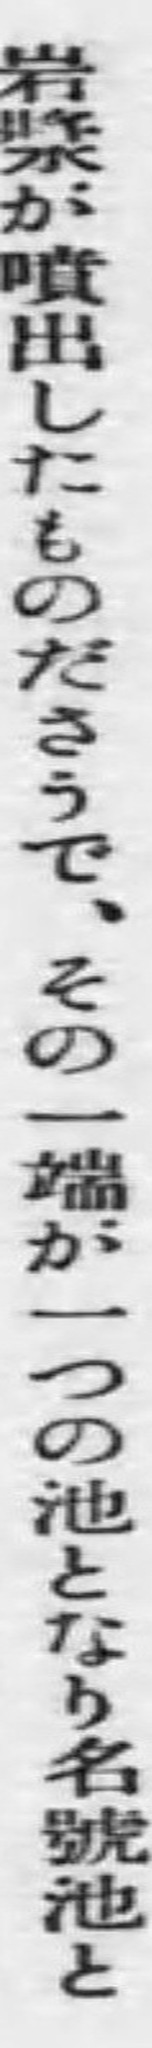岩漿が噴出したものださうで、その一端が一つの池となり名號池と
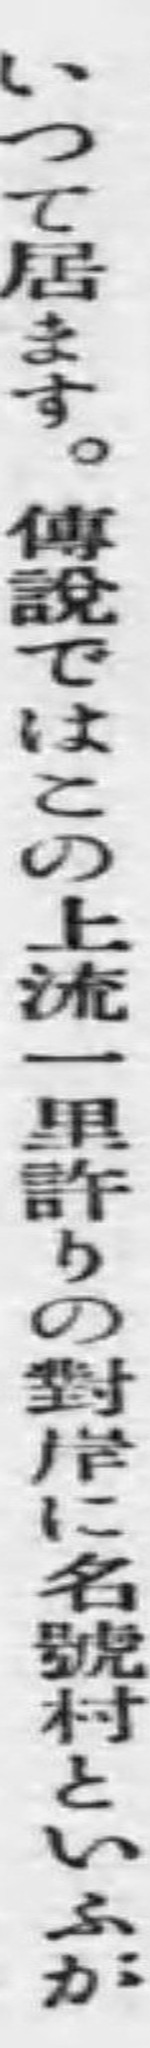いつて居ます。傳説ではこの上流一里許りの對岸に名號村といふが
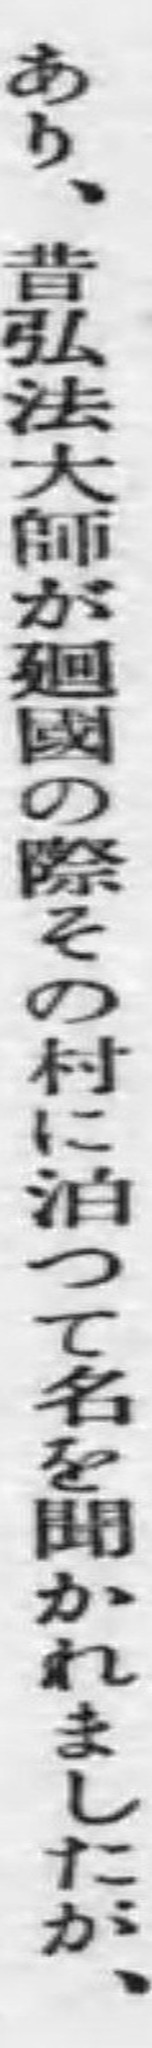あり、昔弘法大師が廻國の際その村に泊つて名を聞かれましたが、
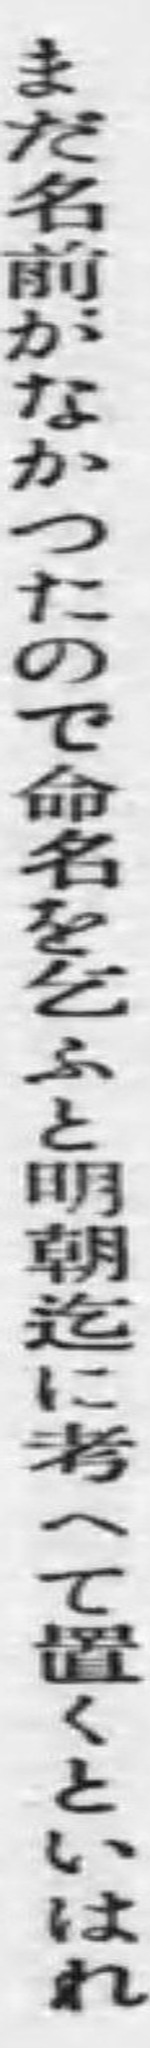まだ名前がなかつたので命名を乞ふと明朝迄に考へて置くといはれ
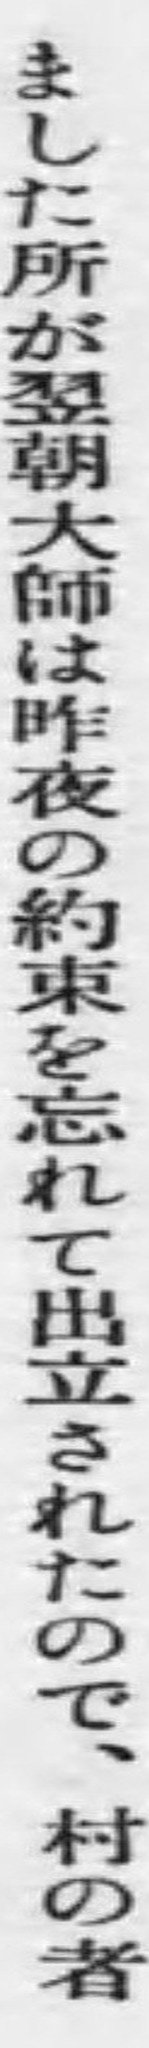ました所が翌朝大師は昨夜の約束を忘れて出立されたので、村の者
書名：東三河道中記 : 豊橋市及其附近案内
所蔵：国立国会図書館 National Diet Library, JAPAN
